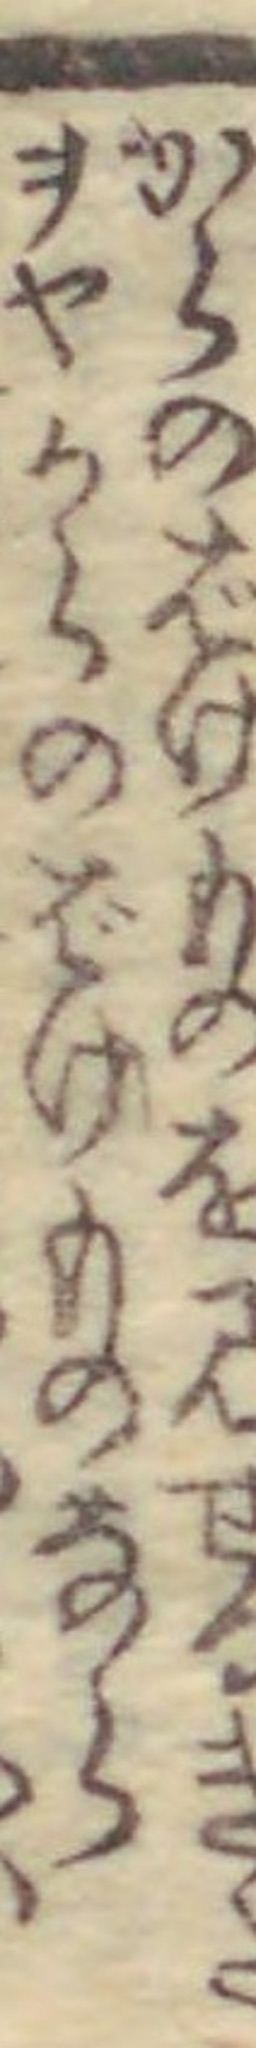ヲヤからのばけものなら
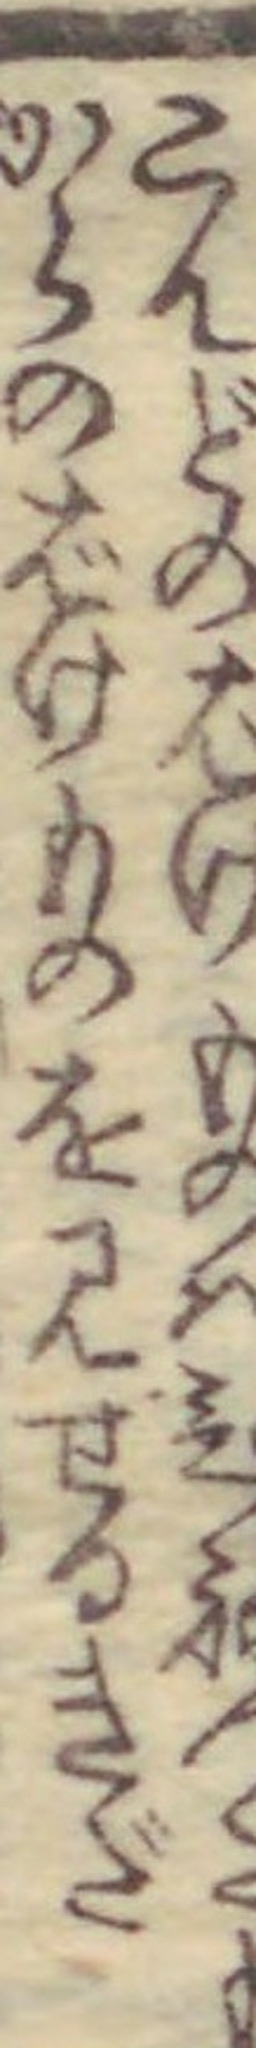からのばけものを見せるきだ
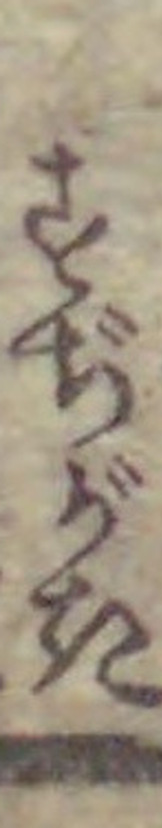すぢがき
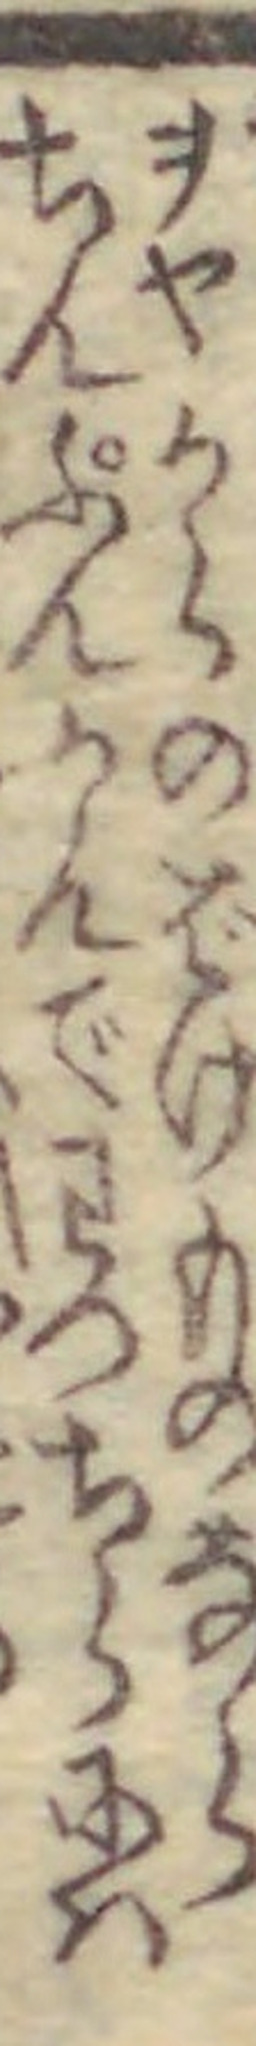ちんぷんかんでわつちらには
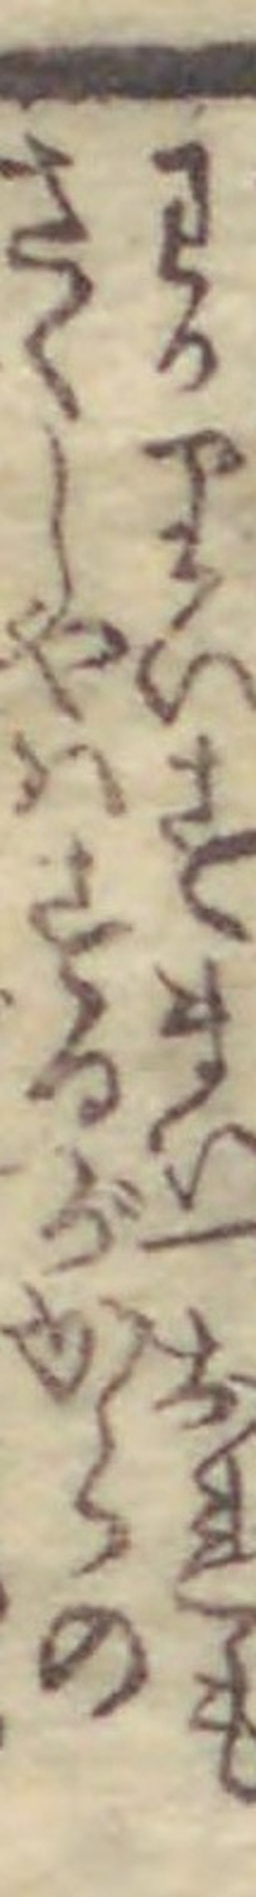さくしやはするがからの
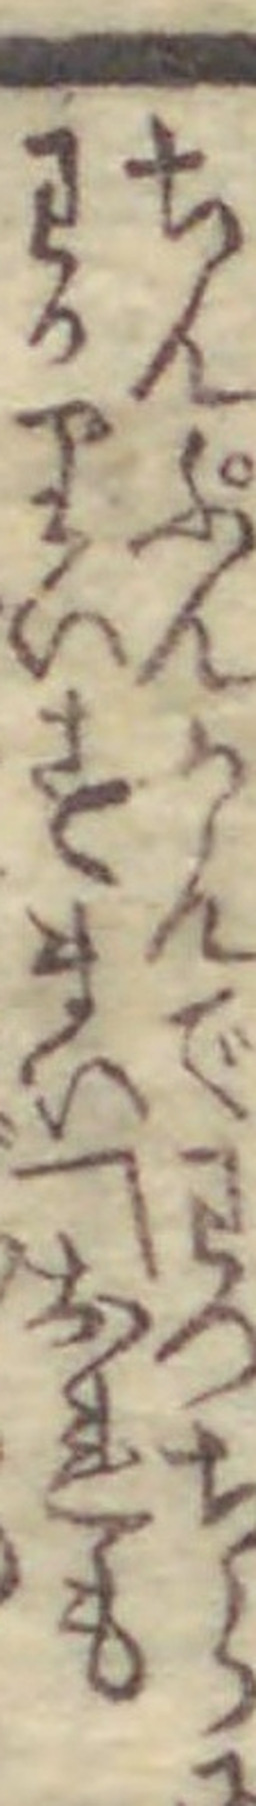わかりいすまい〽おれも
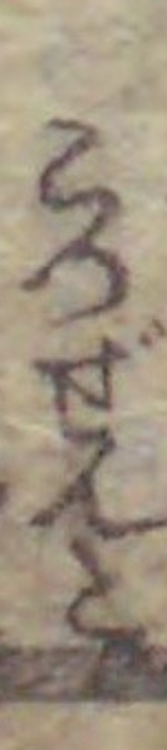こつぜんと
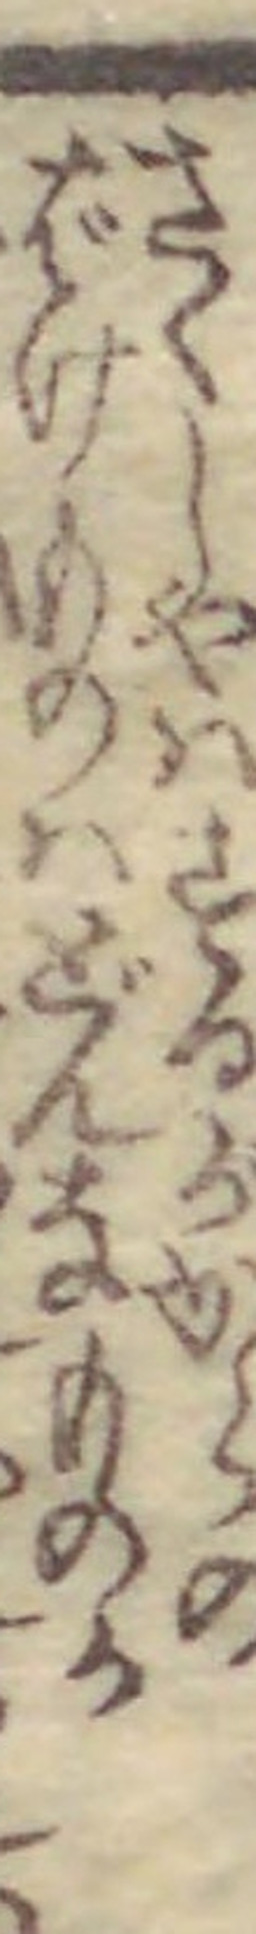ばけものはどんなものか
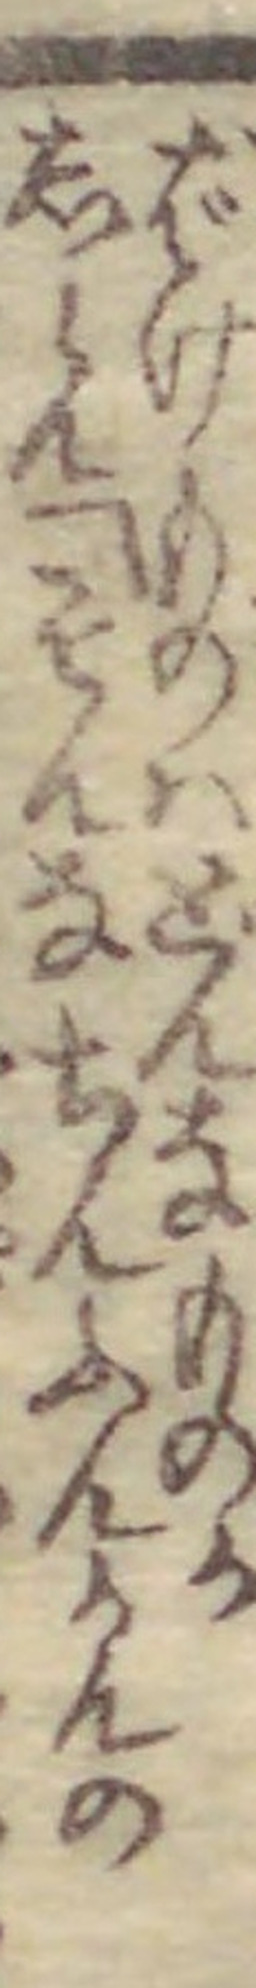しらん〽そんなちんふんかんの
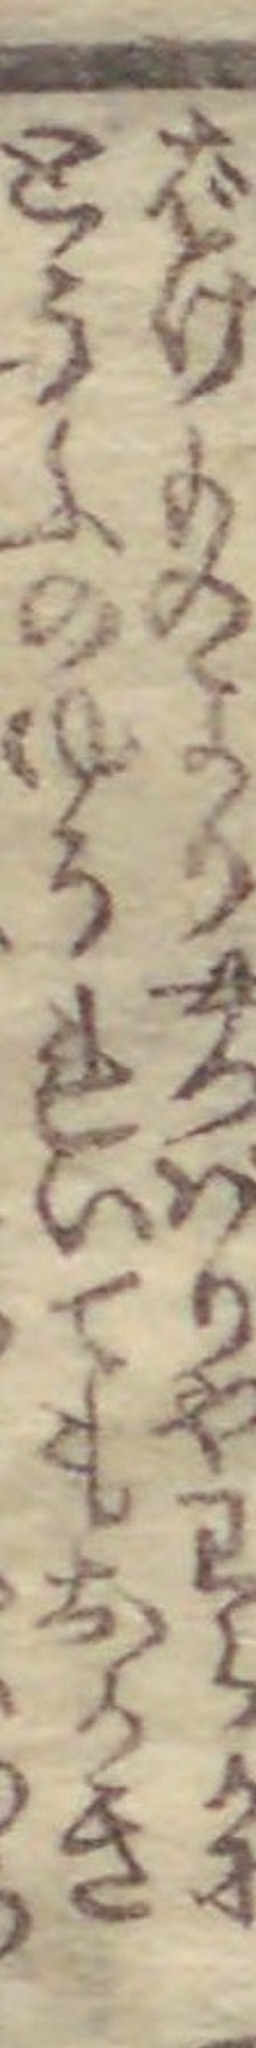とうふのゆうれいてもおかき
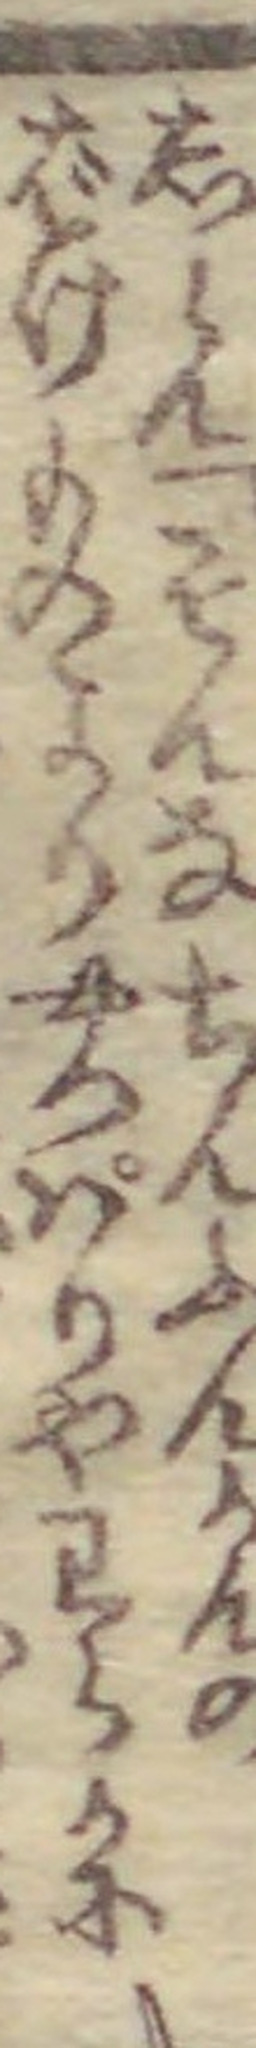ばけものよりやつぱりやわらかに
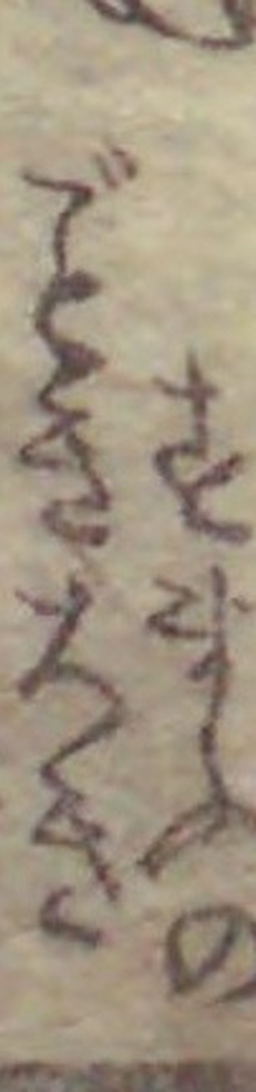ごとき大き
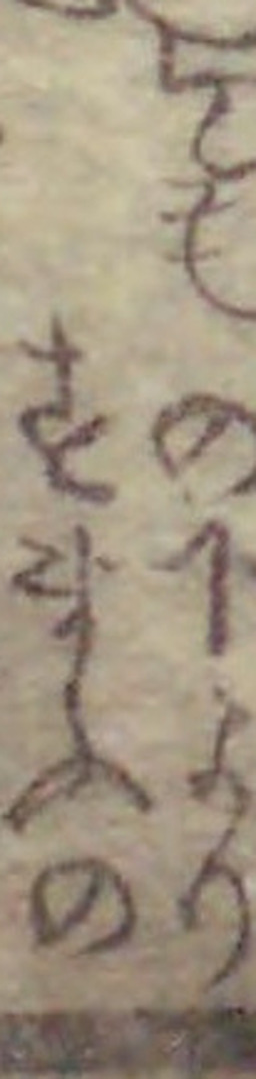すまふの
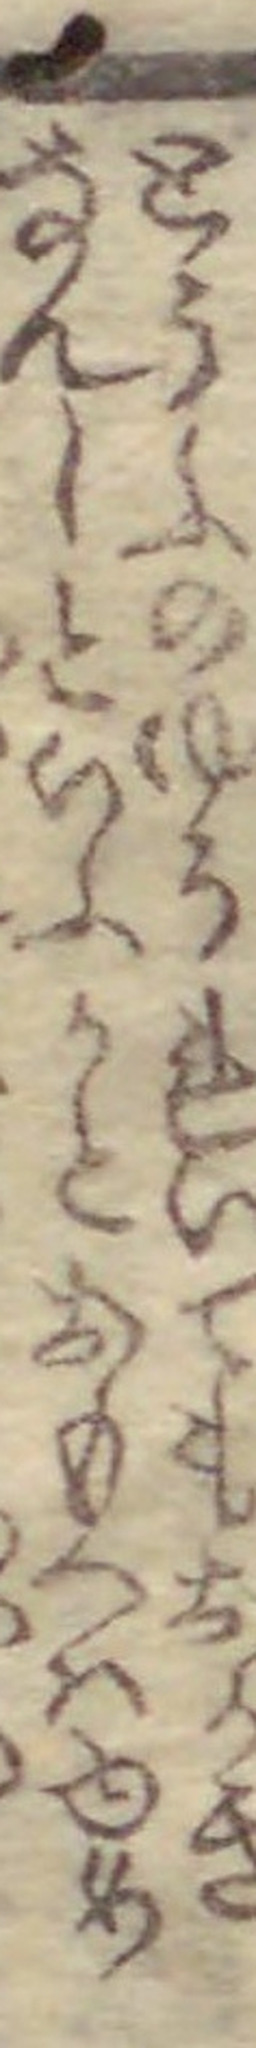なんしといふかとおもへはゆめ
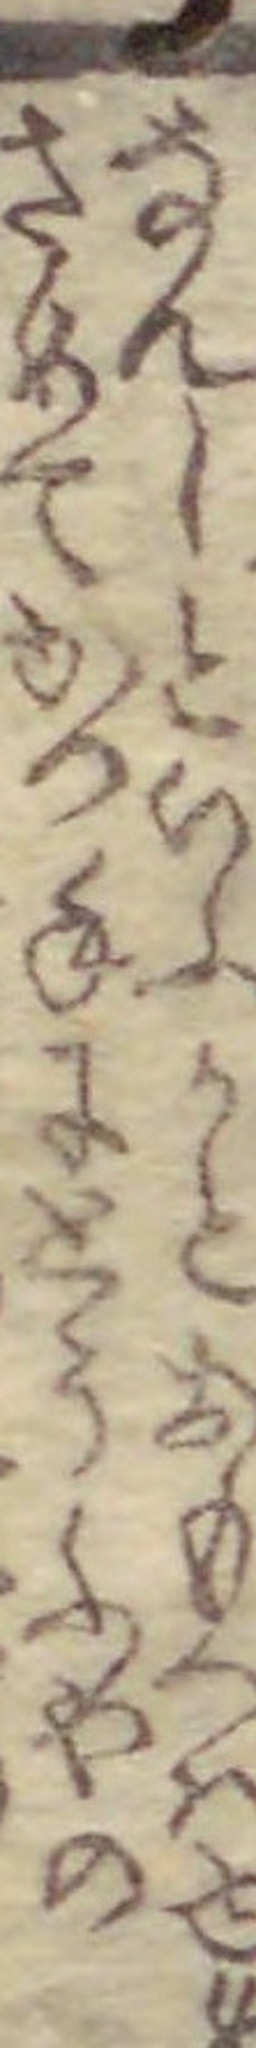さめてかつ手にとうふやの
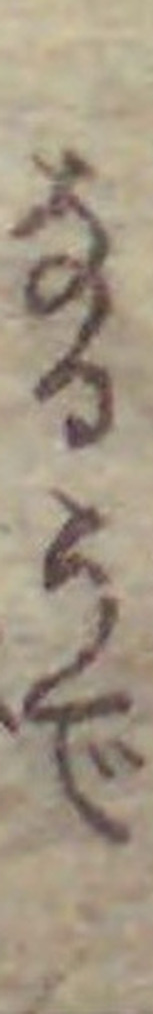なるうで
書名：大時代唐土化物 3巻. 曽我太夫染
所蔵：国立国会図書館 National Diet Library, JAPAN
